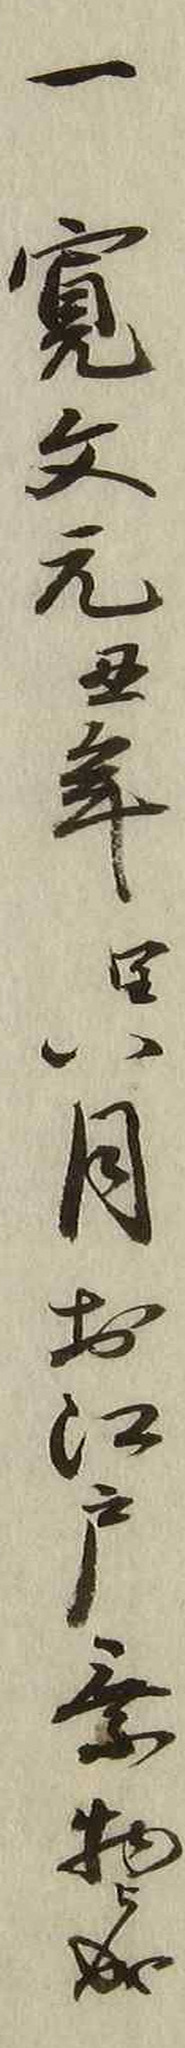一寛文元丑年閏八月於江戸乗物被成
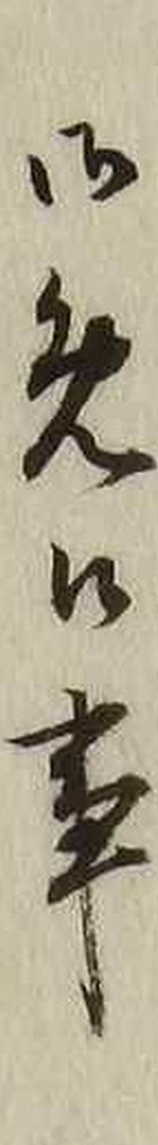御免候事
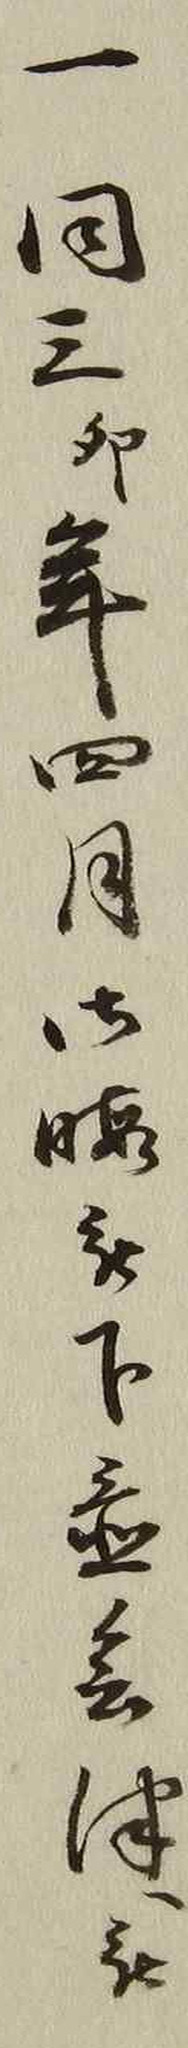一同三卯年四月御暇被下置会津江被
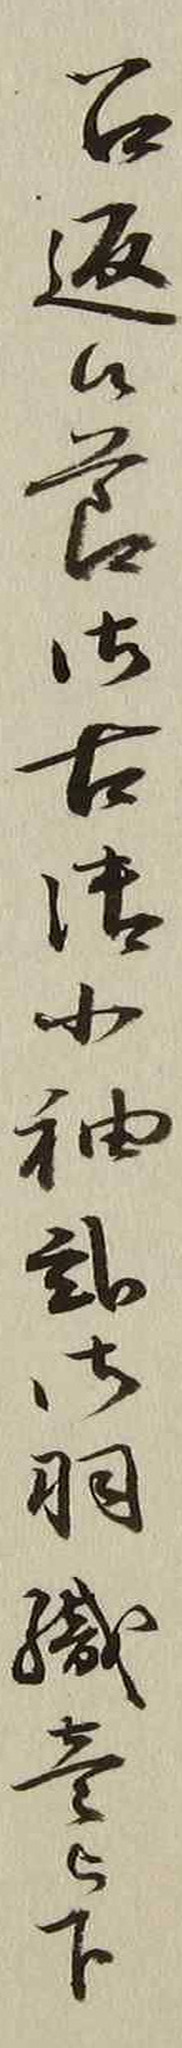召返候節御古御小袖弐御羽織壱被下
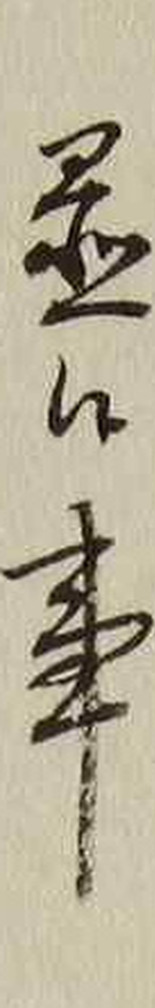置候事
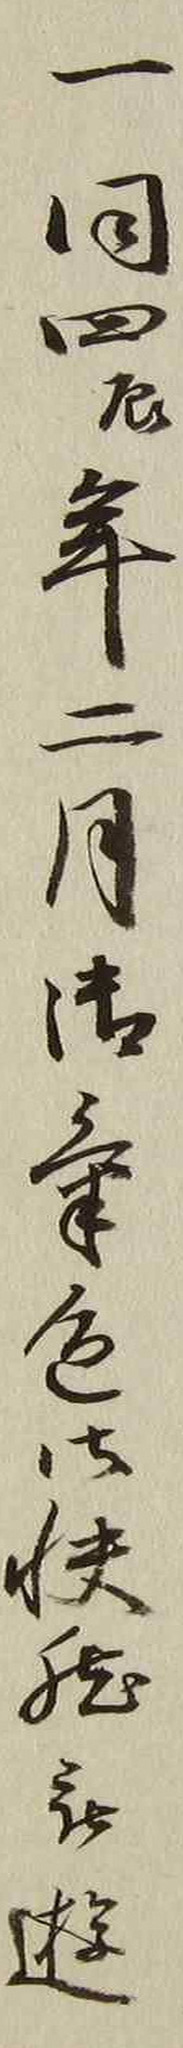一同四辰年二月御気色御快然被遊
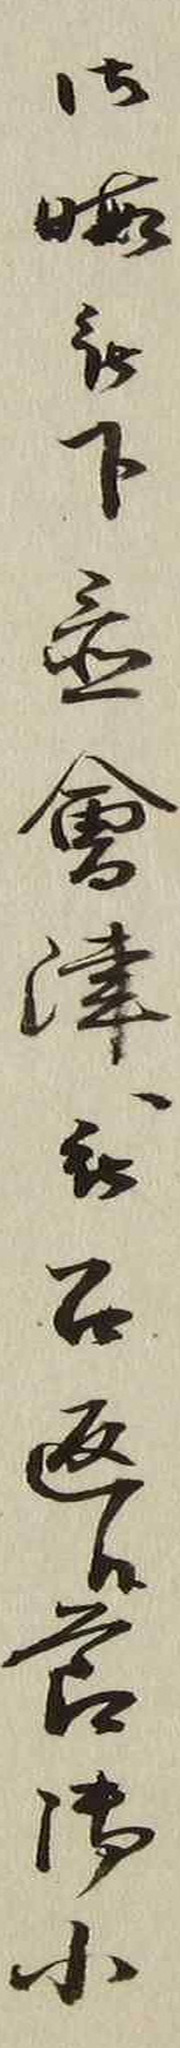御暇被下置会津へ被召返候節御小
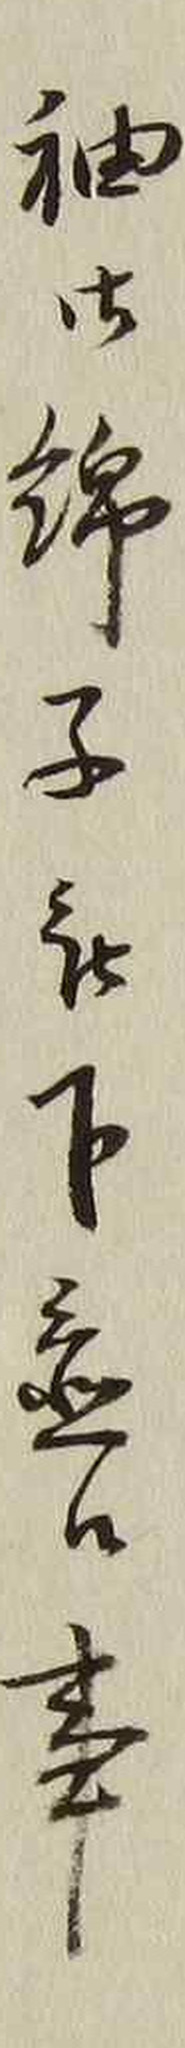袖御綿子被下置候事
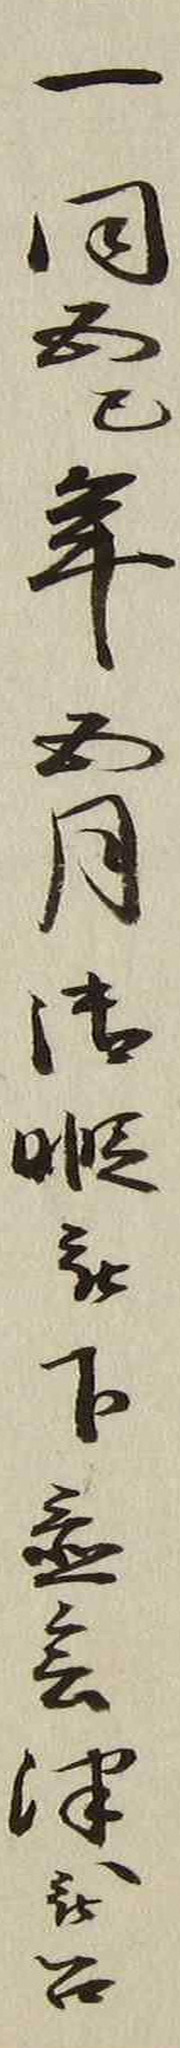一同五巳年五月御暇被下置会津へ被召
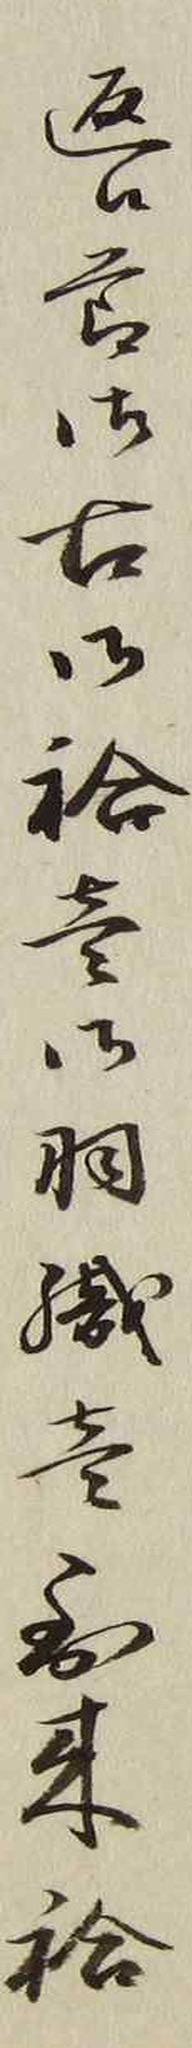返候節御古御袷壱御羽織壱到来袷
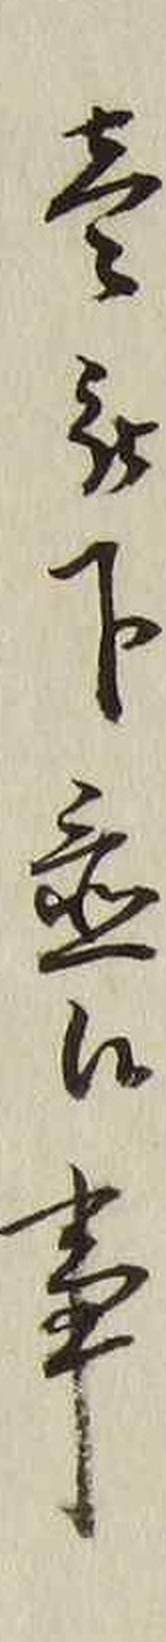壱被下置候事
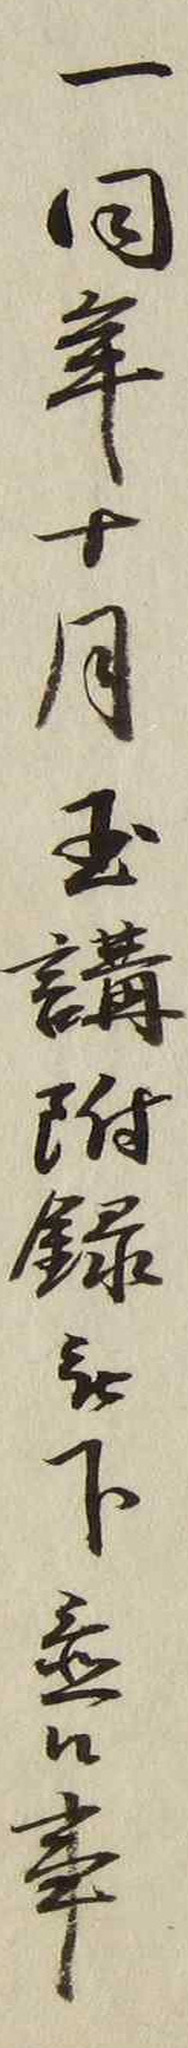一同年十月玉講附録被下置候事
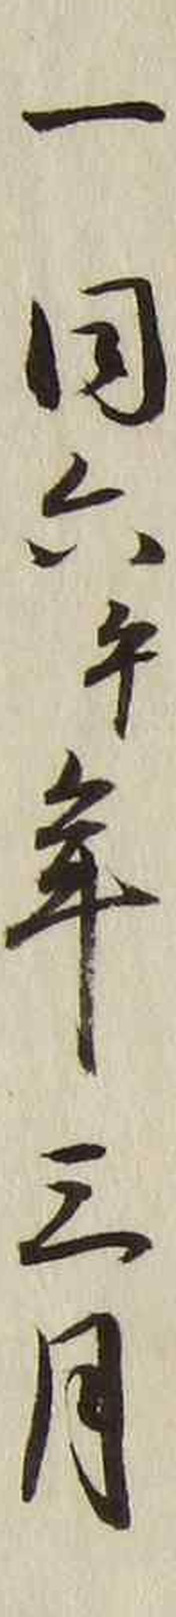一同六午年三月

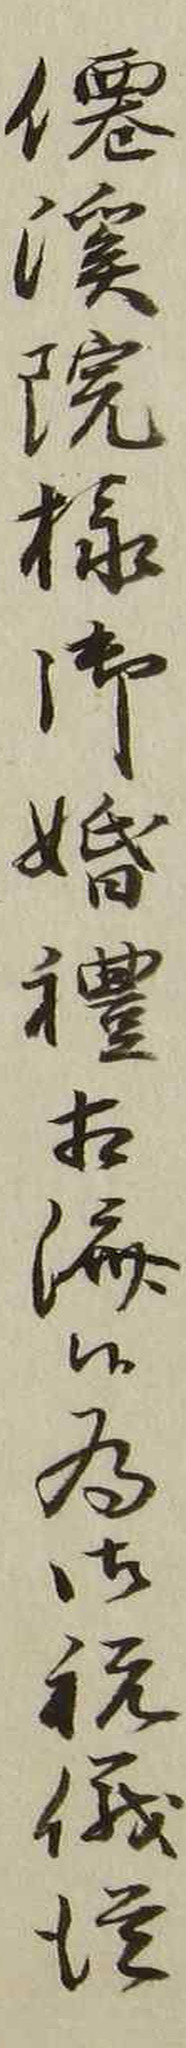僊渓院様御婚礼相済候為御祝儀従
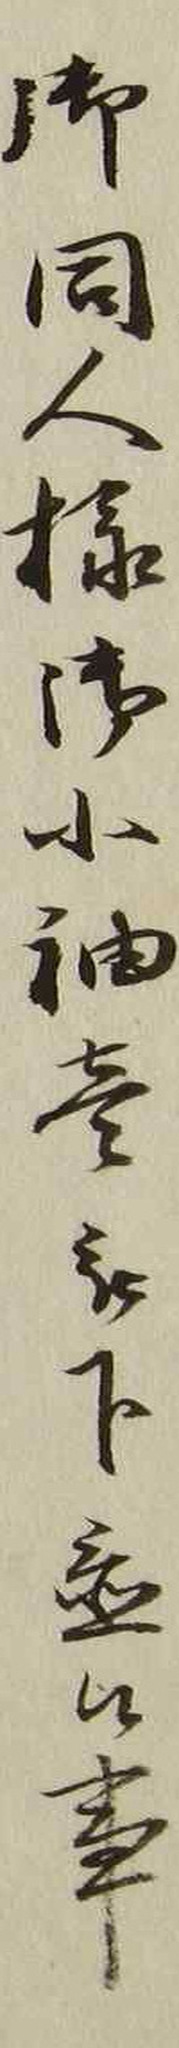御同人様御小袖壱被下置候事
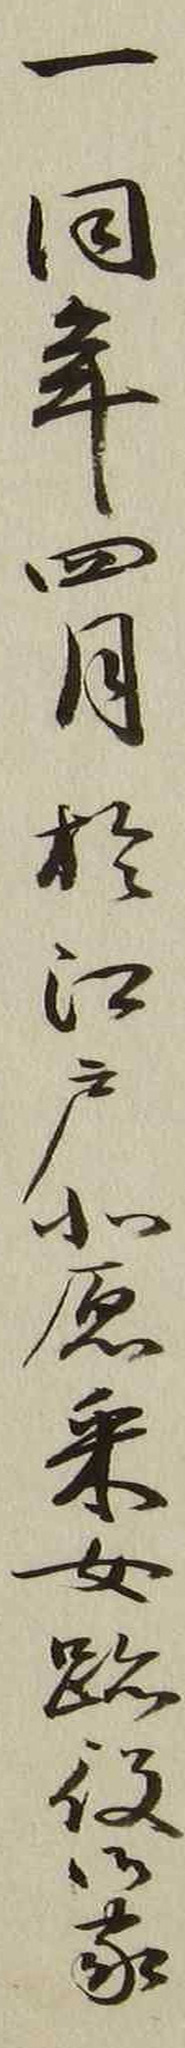一同年四月於江戸北原采女跡役御家
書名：諸士系譜　巻之125　た之部1
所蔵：会津若松市立会津図書館
